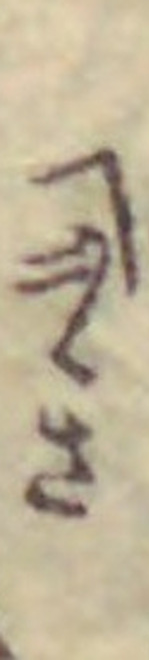〽ヲヽさ
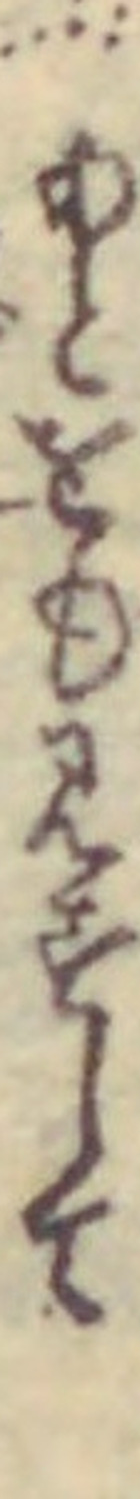あとをも見すして
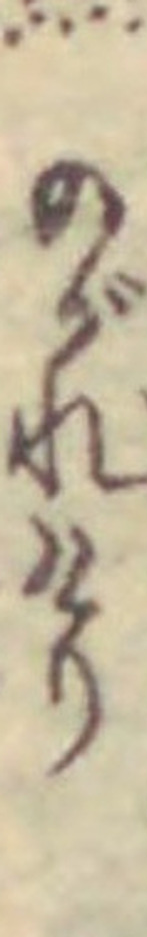のがれけり
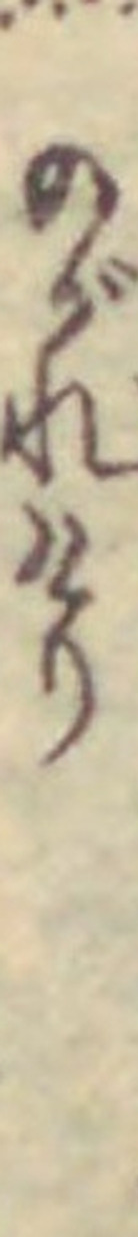のがれけり
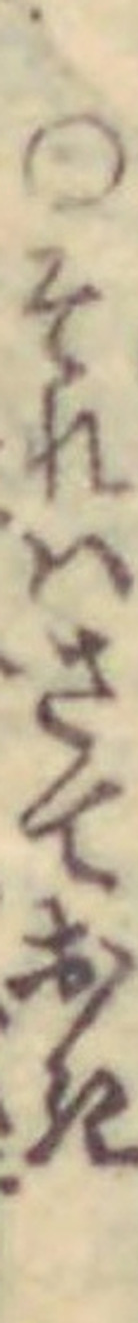○それはさておき
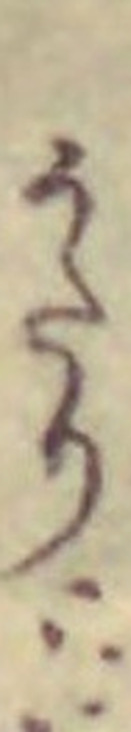かたり
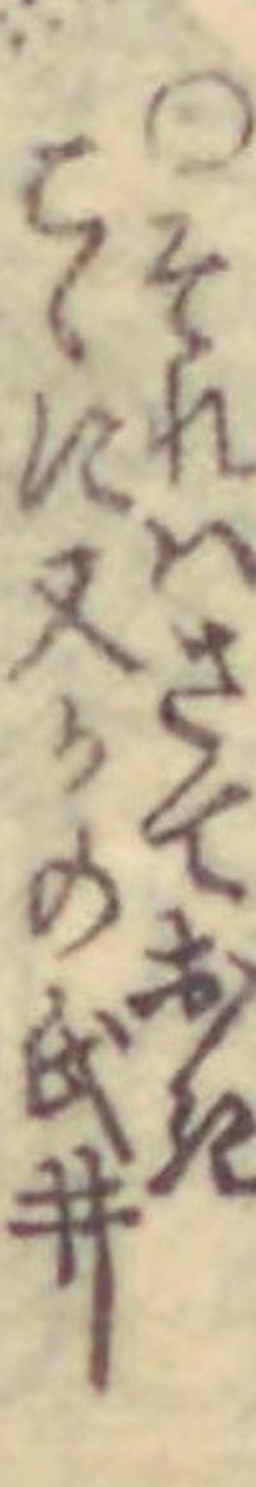こゝに又かの氏井
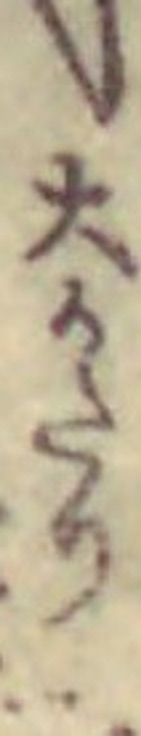大かたり
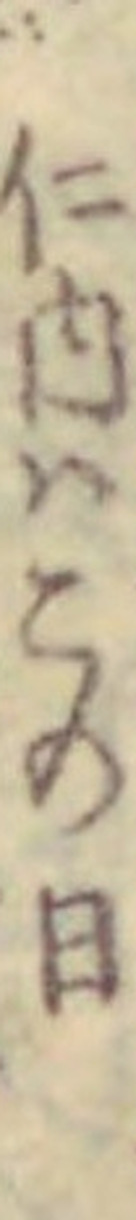仁内はこの日
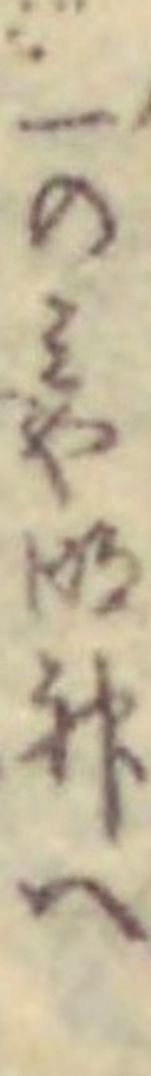一のみや明神へ
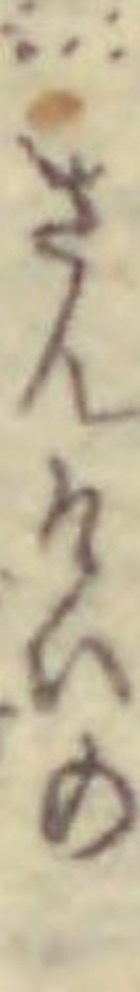さんけいの
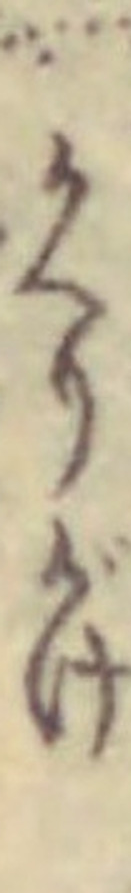かへりがけ
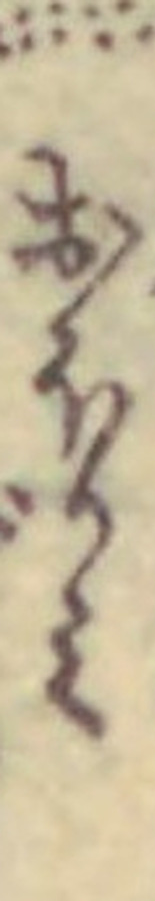おほかみ
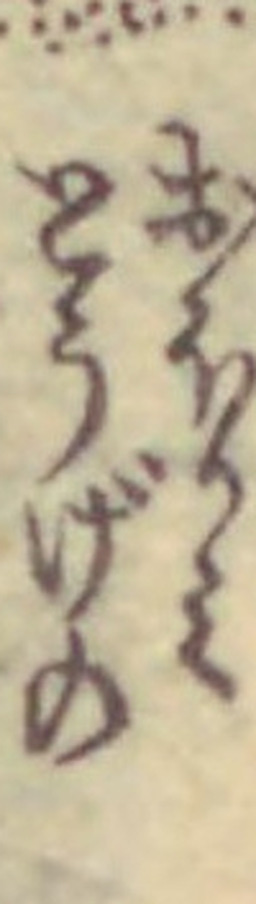とうげの
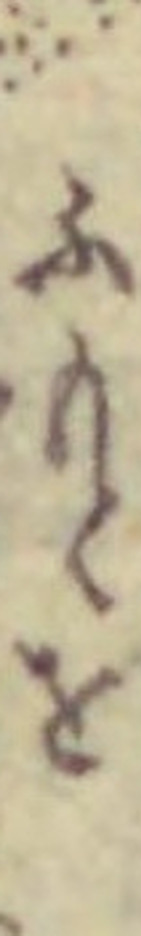ふもとを
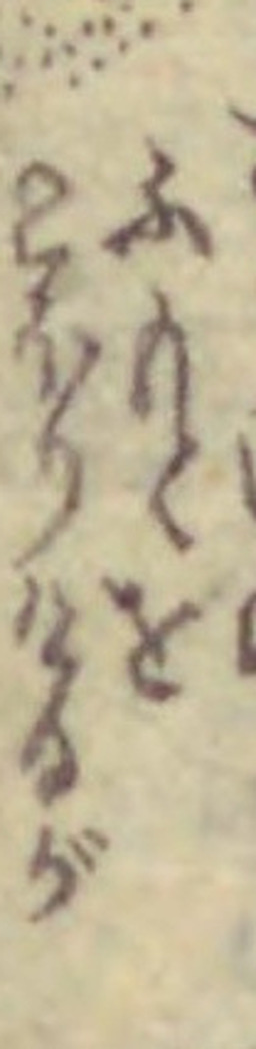とほりけるが
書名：八ツ目鱣因縁物語 3巻
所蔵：国立国会図書館 National Diet Library, JAPAN
